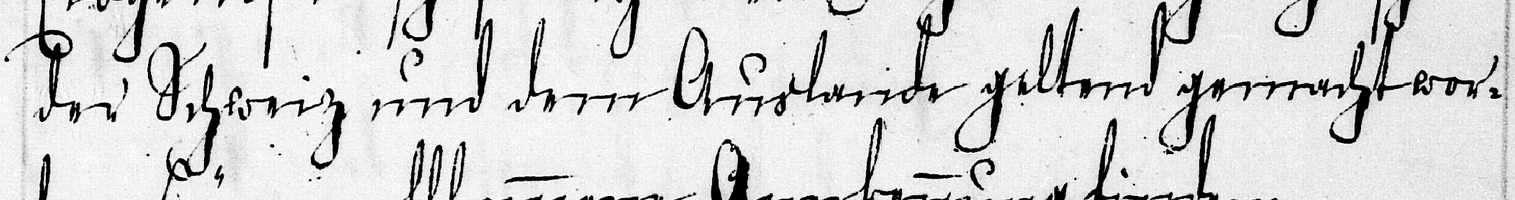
der Schweiz und dem Auslande geltend gemacht wor¬
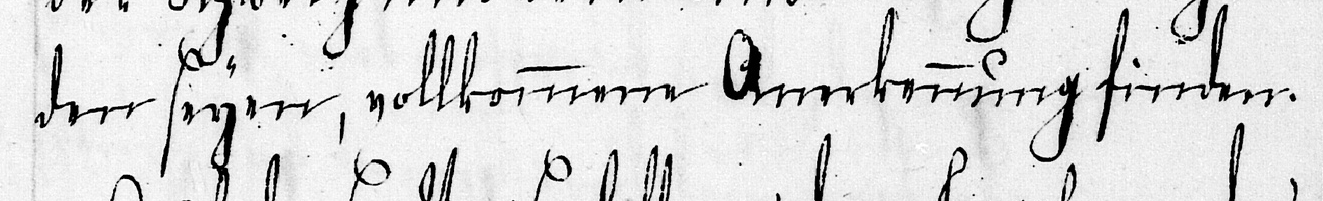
den seyen, vollkommene Anerkennung finden.
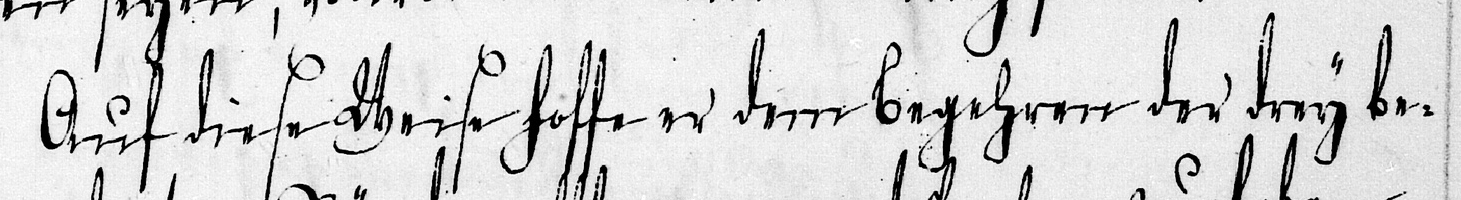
Auf diese Weise hoffe er dem Begehren der drey be¬
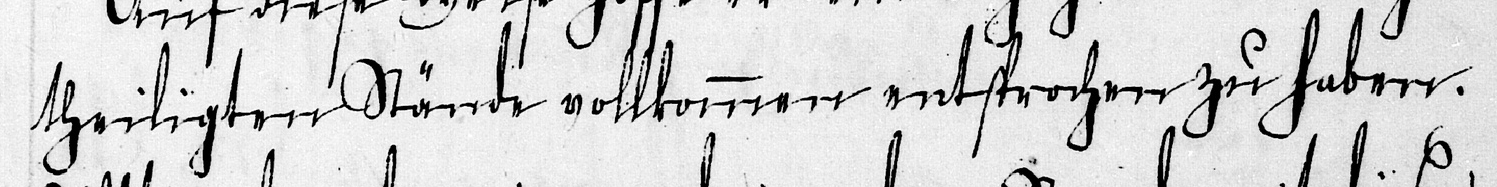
theiligten Stände vollkommen entsprochen zu haben.
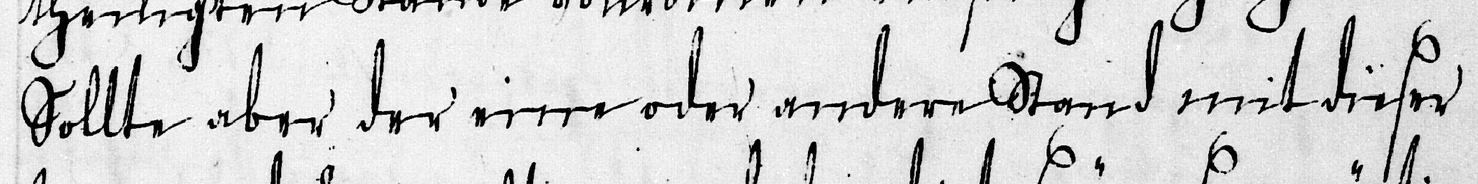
Sollte aber der eine oder andere Stand mit dieser
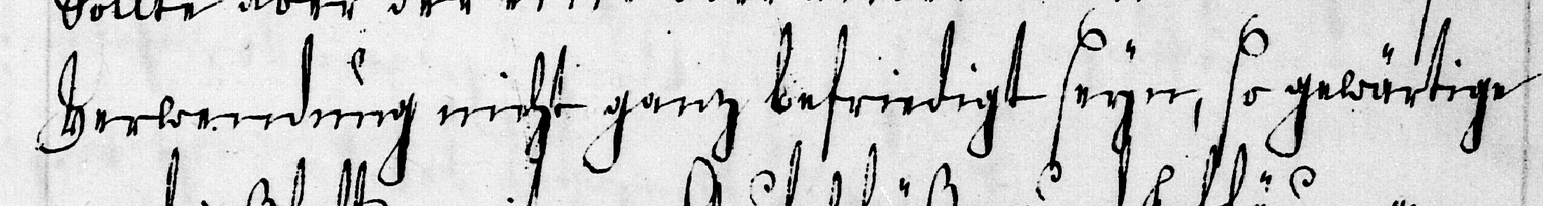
Verwendung nicht ganz befriedigt seyn, so gewärtige
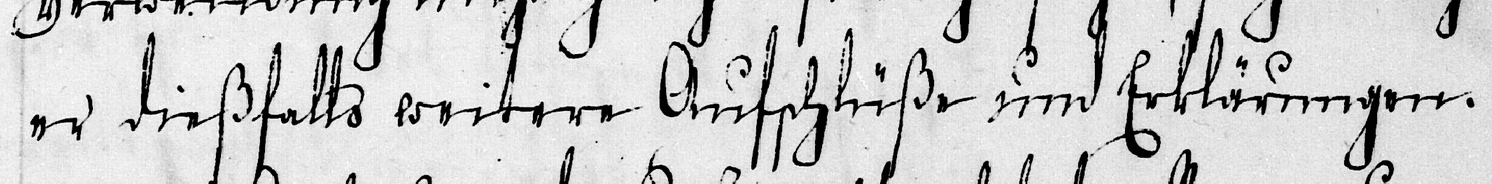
er dießfalls weitere Aufschlüße und Erklärungen.
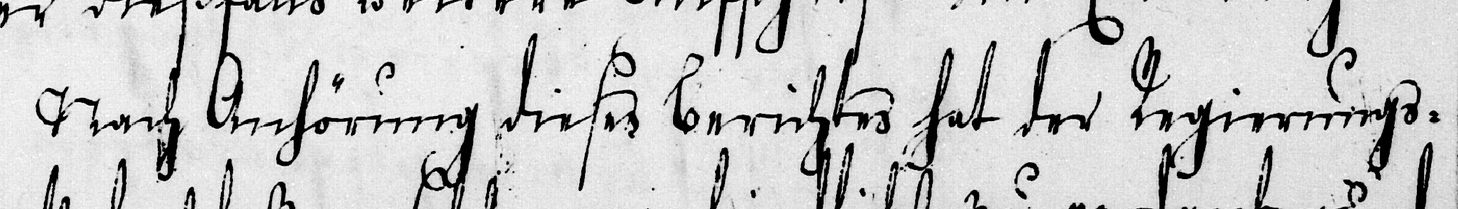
Nach Anhörung dieses Berichtes hat der Regierungs¬
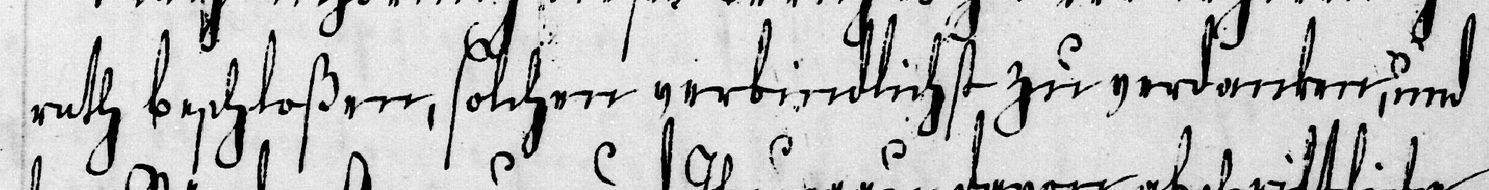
rath beschloßen, solchen verbindlichst zu verdanken, und
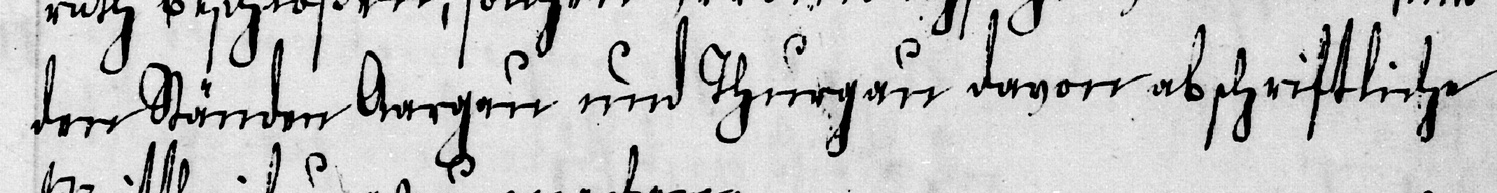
den Ständen Aargau und Thurgau davon abschriftliche
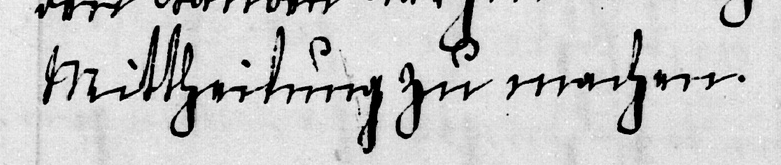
Mittheilung zu machen.
